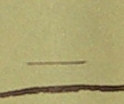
-
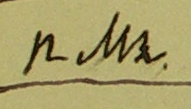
12. Mr.
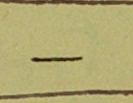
-
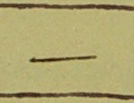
-
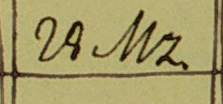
28. Mr.
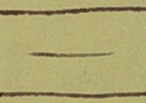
-
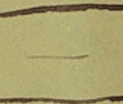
-
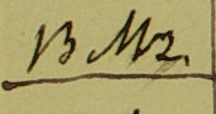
13. Mr.
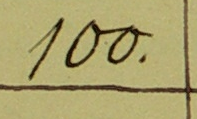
100
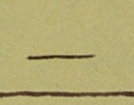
-
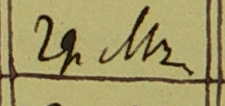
29. Mr-
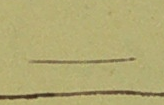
-
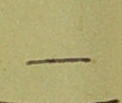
-
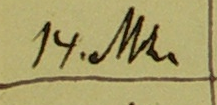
14. Mr.
